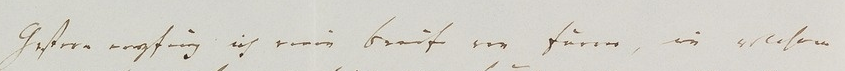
Gestern empfing ich einen Brief von Furrer, in welchem
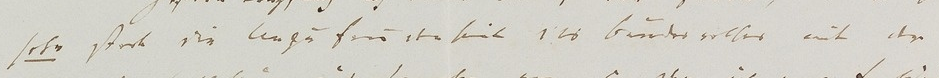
sehr stark die Unzufriedenheit des Bundesrathes mit der
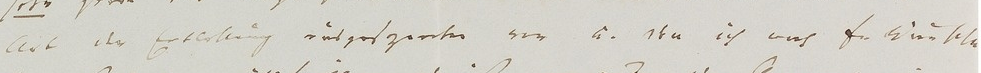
Art der Entlassung ausgesprochen war u. den ich nach Fs. Wunsche
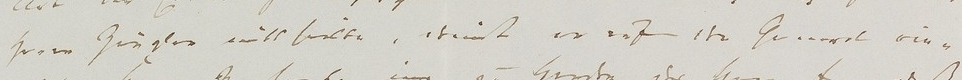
Herrn Ziegler mittheilte, damit er auf den General ein-
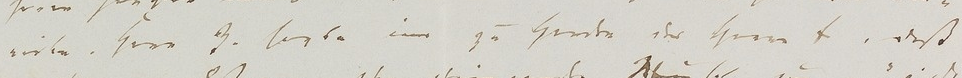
wirke. Herr Z. sagte mir zu Handen des Herrn F, daß
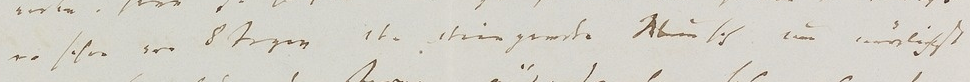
er schon vor 8 Tagen den dringenden Wunsch um möglichst
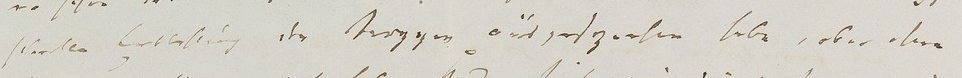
schnelle Entlassung der Truppen ausgesprochen habe, aber ohne
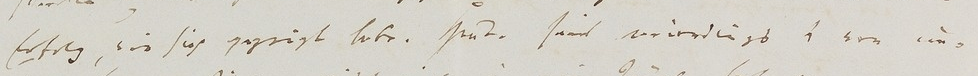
Erfolg, wie sich gezeigt habe. Heute sind neuerdings 2 von un-
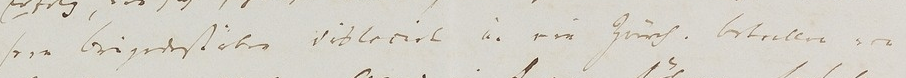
sern Brigadestäben dislocirt u. ein Zürch. Bataillon von
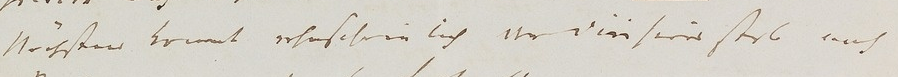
Nächstens kommt wahrscheinlich der Divisionsstab nach
